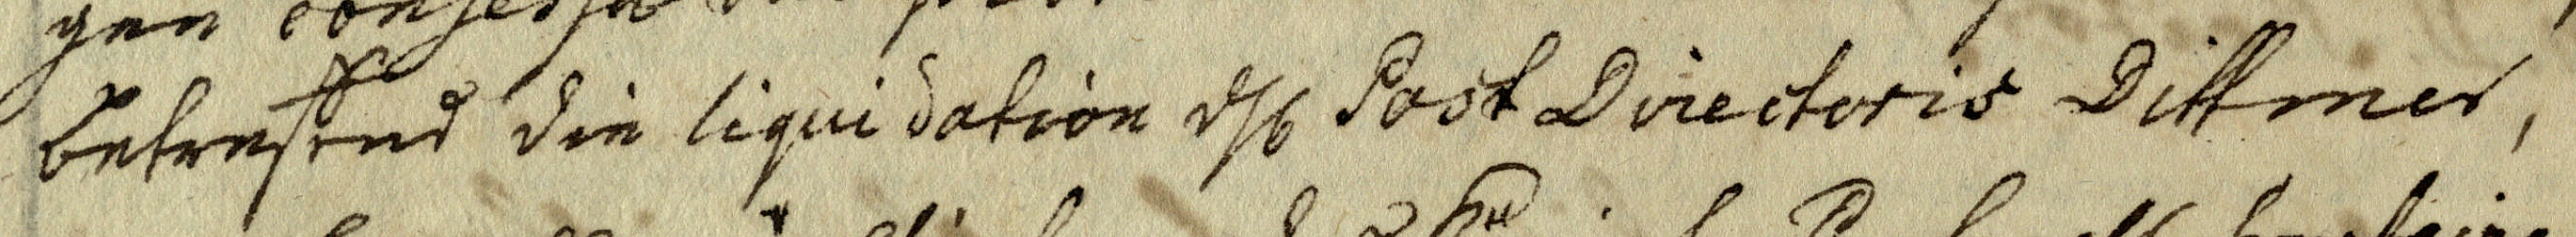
betreffend die liquidation dh Post Directors Dittmer,
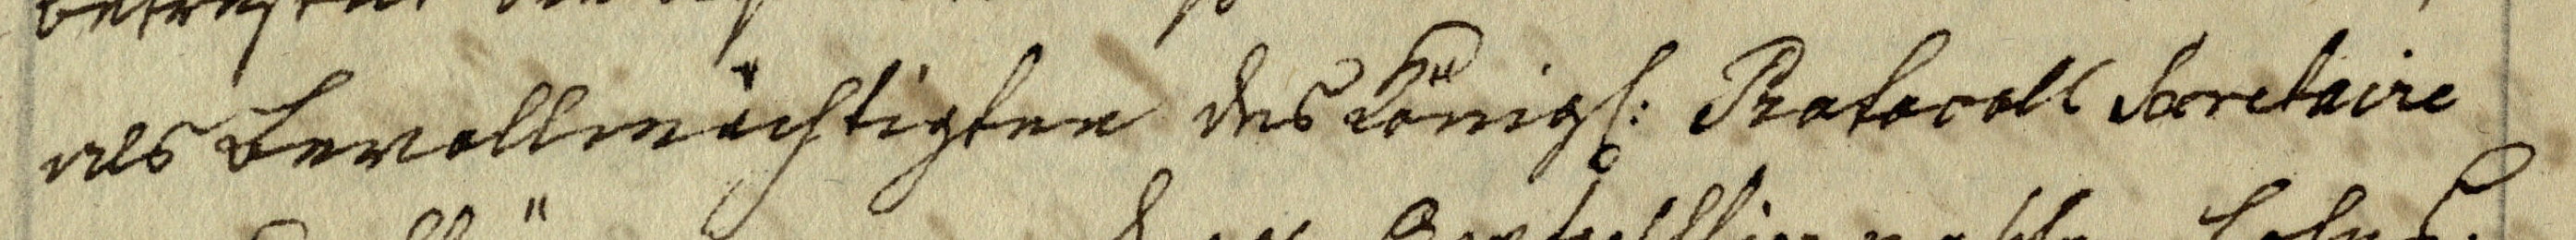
als Bevollmächtigten des Königl. Protocoll Secretaire
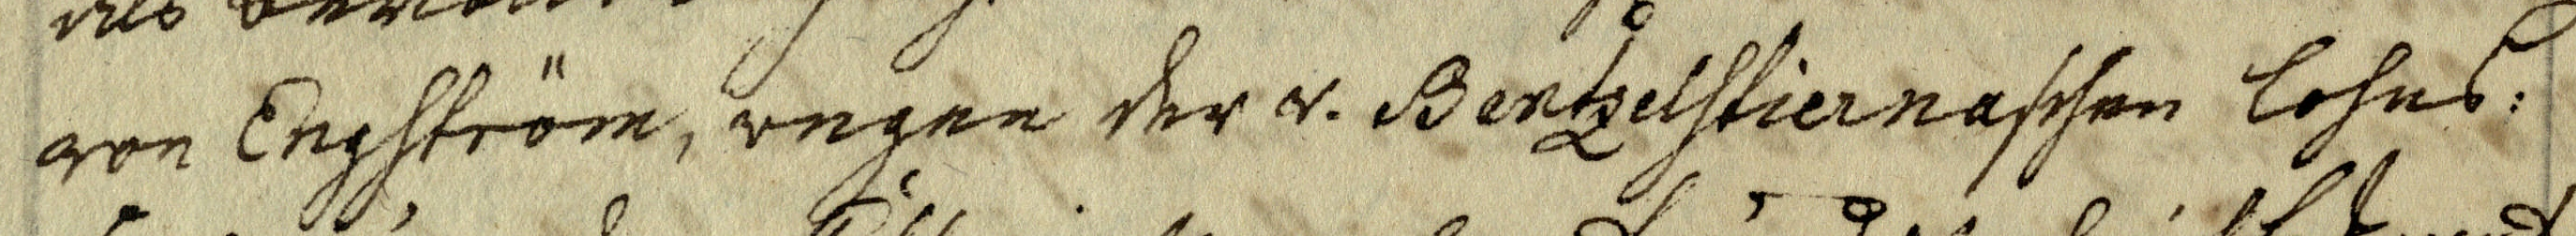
von Engström, wegen der v. Bentzelstiernaschen Lohns-
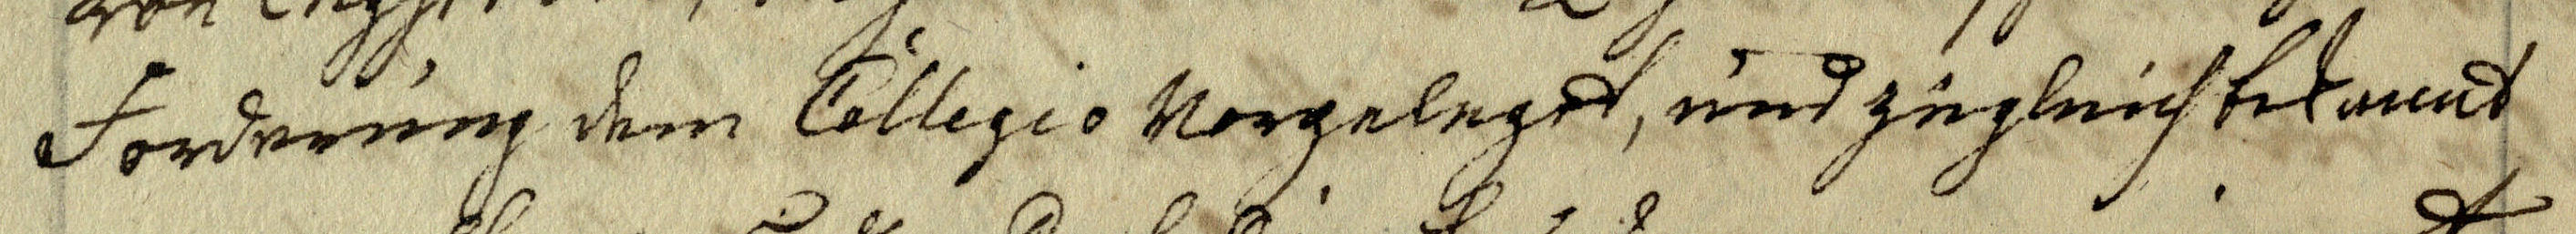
Forderung dem Collegio vorgeleget, und zugleich bekannt
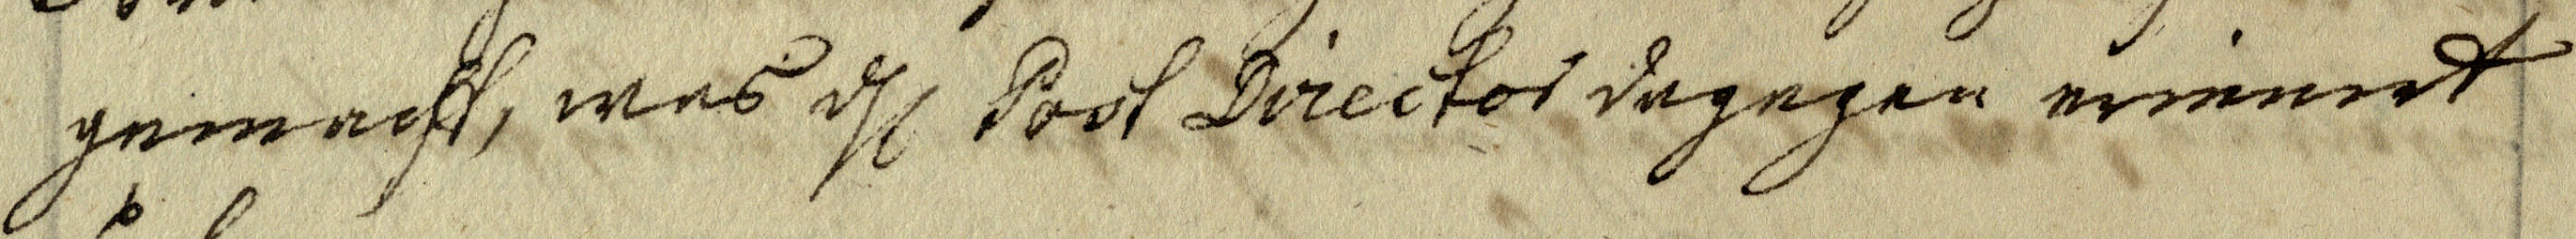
gemacht, was dh Post Director dagegen erinnert
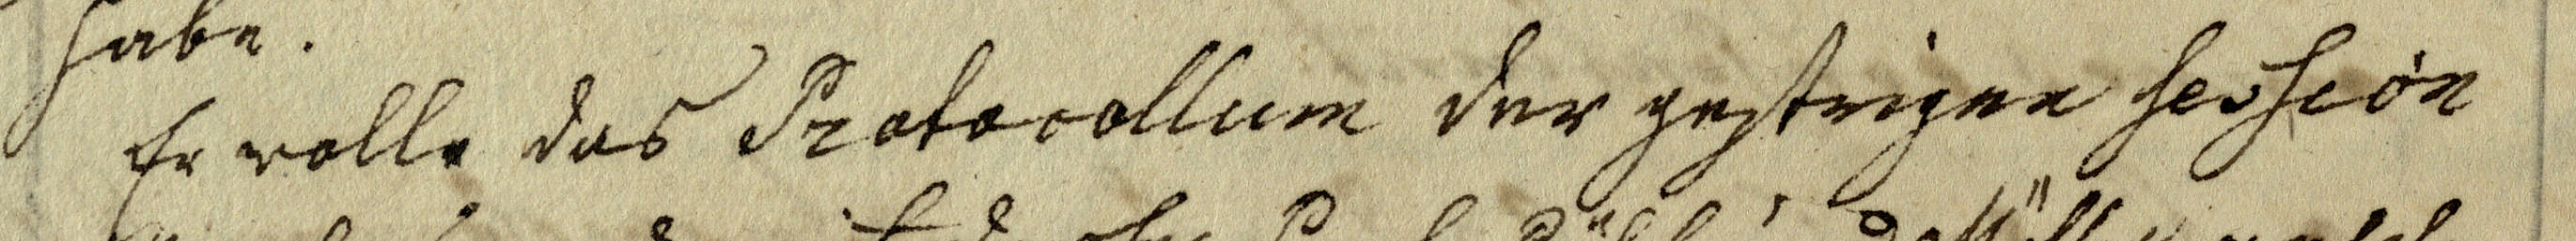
Er wolle das Protocollum der gestrigen session
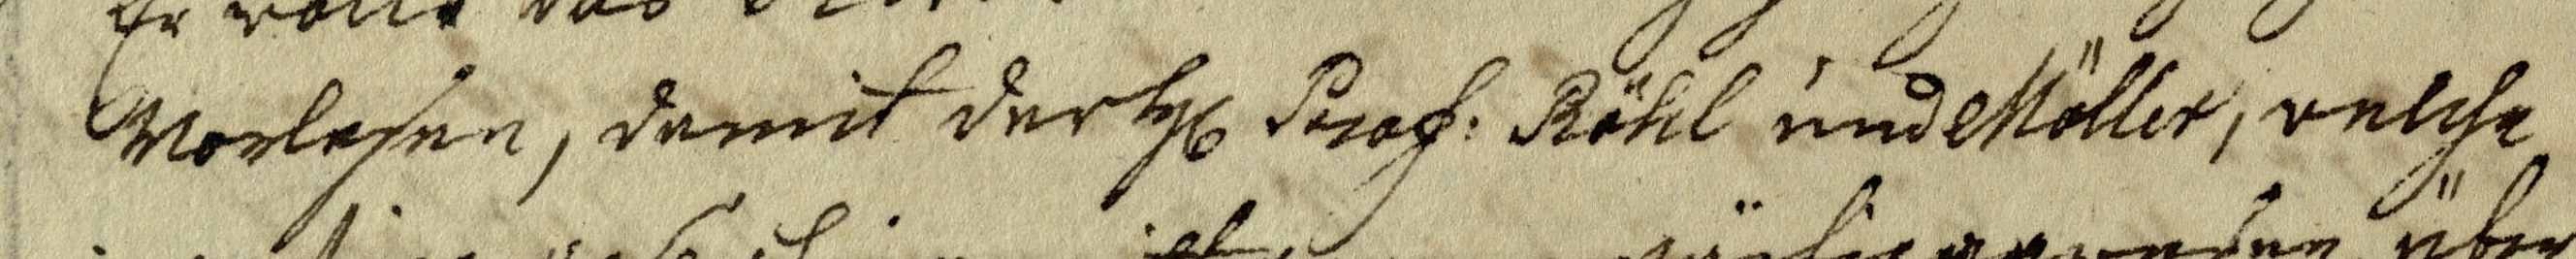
vorlesen, damit dh Prof. Röhl und Möller, welche
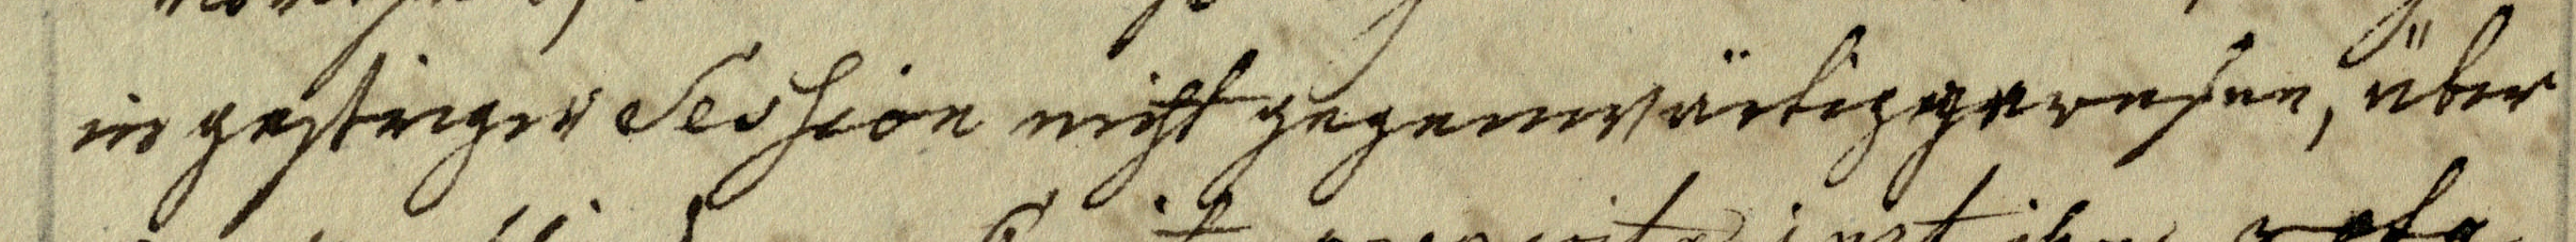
in gestriger Session nicht gegenwärtig gewesen, über
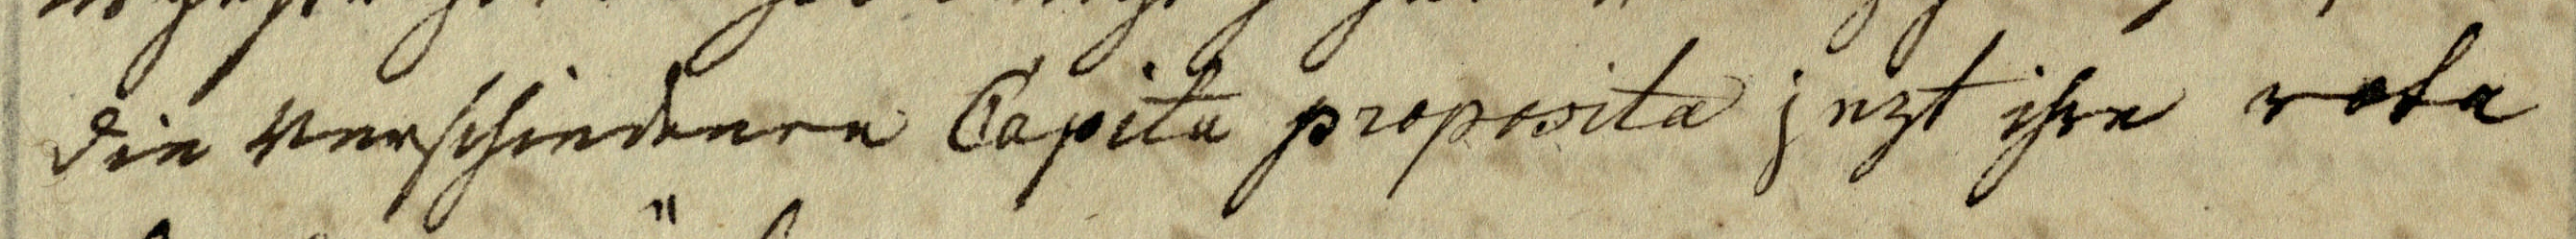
die verschiedenen Capitu proposita jezt ihre vota
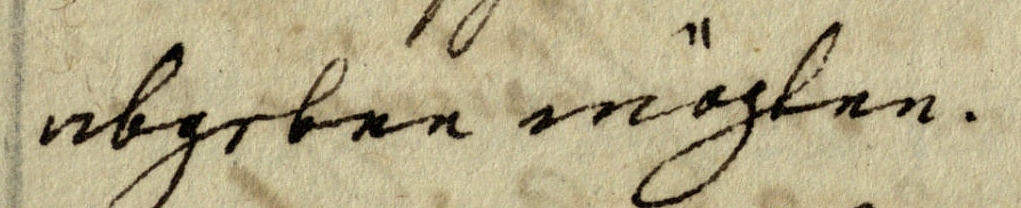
abgeben mögten.
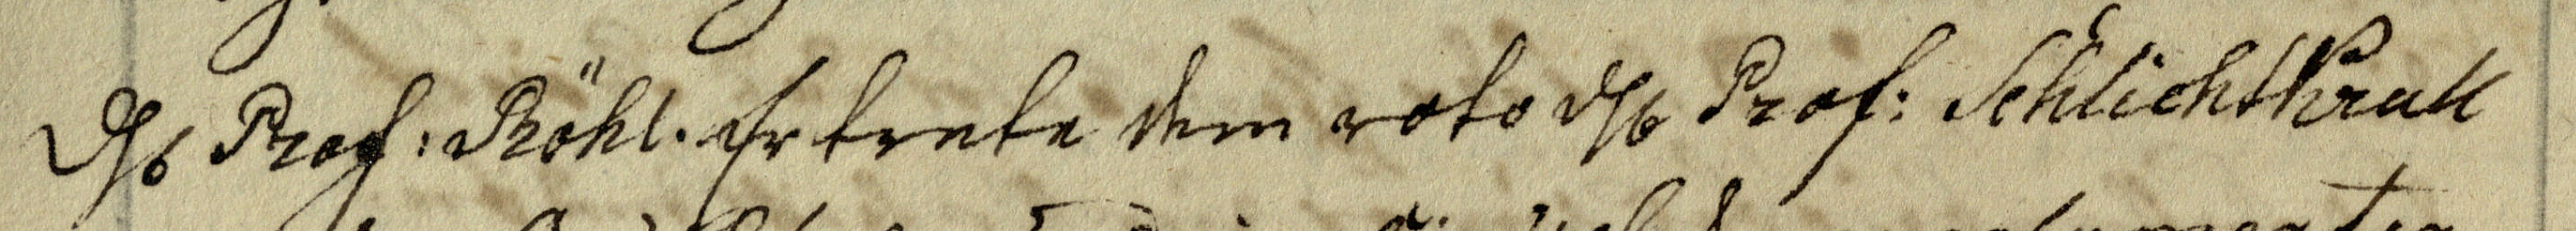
dh Prof. Röhl. Er trete dem voto dh Prof. Schlichtkrull
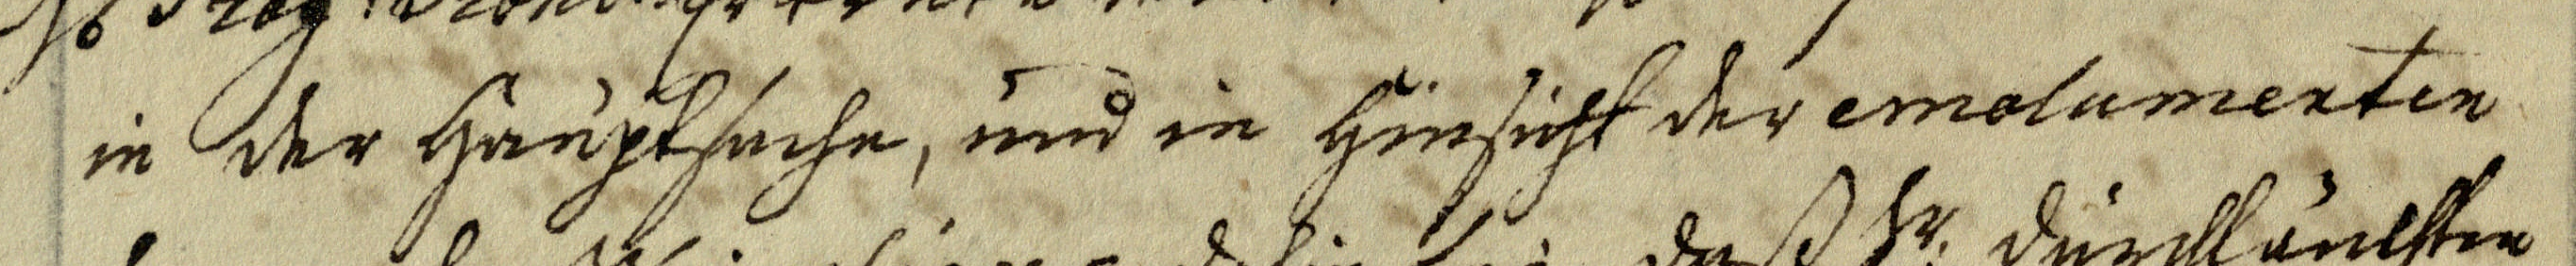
in der Hauptsache, und in Hinsicht der emolumenten
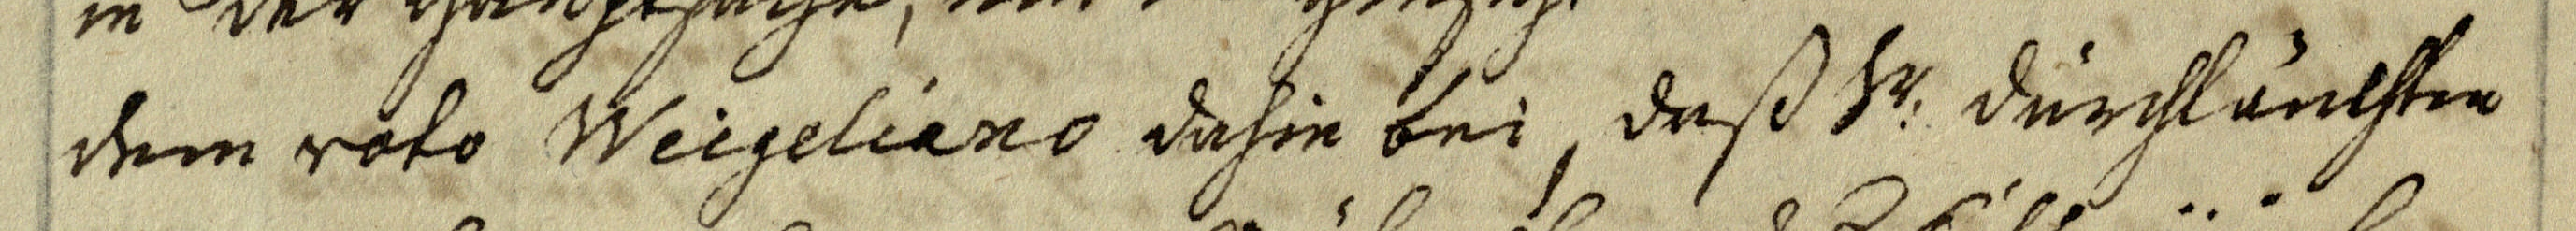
dem voto Weigeliano dahin bei, daß Sr Durchlauchten
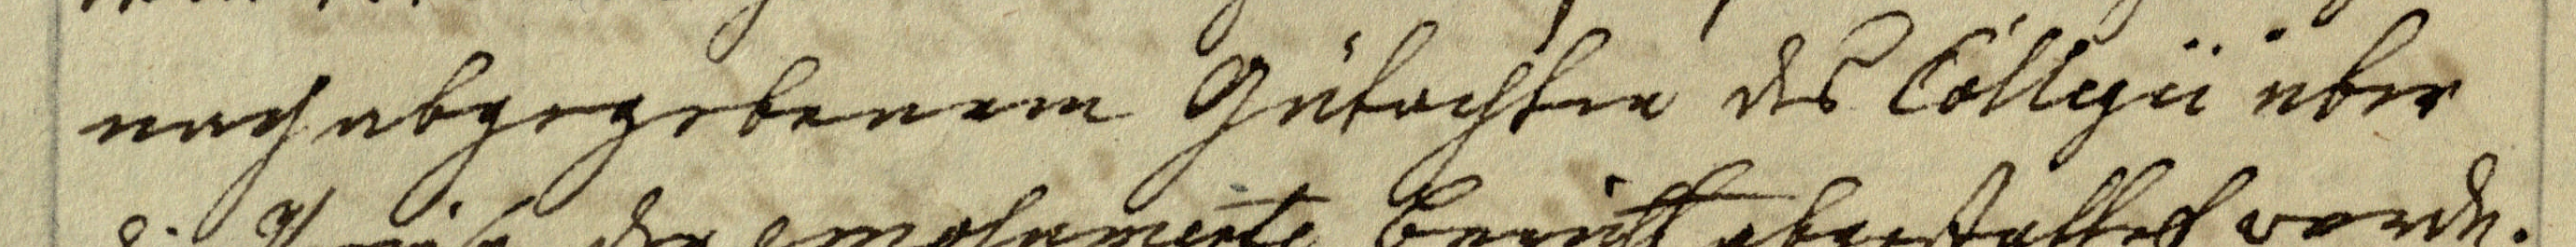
nach abgegebenen Gutachten des Collegii über
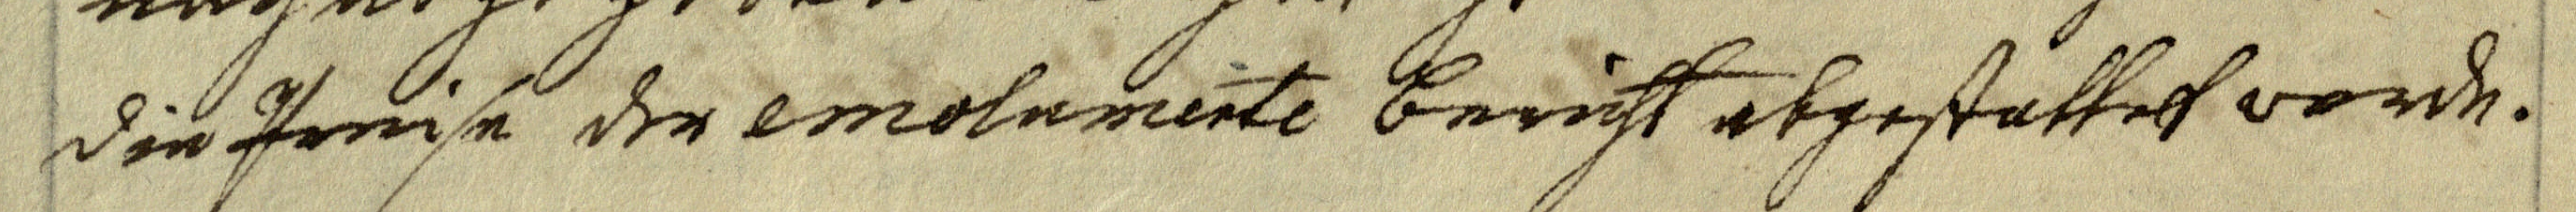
die Preise der emolumente Bericht abgestattet werde.
